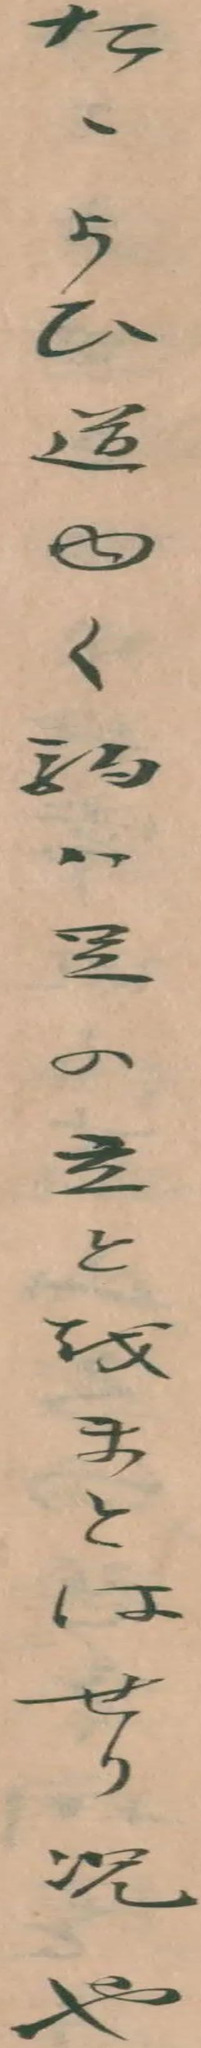たゝよひ道ゆく駒は足の立とをまとはせり況や
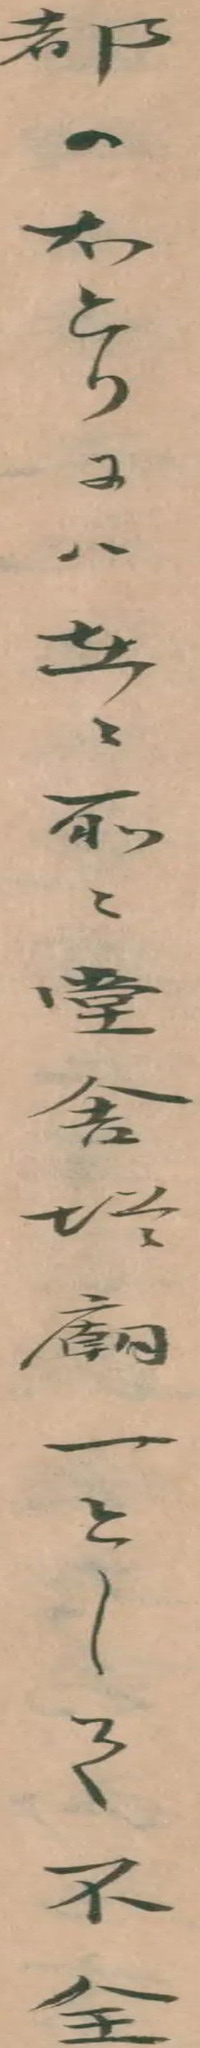都のほとりには在々所々堂舎塔廟一として不全
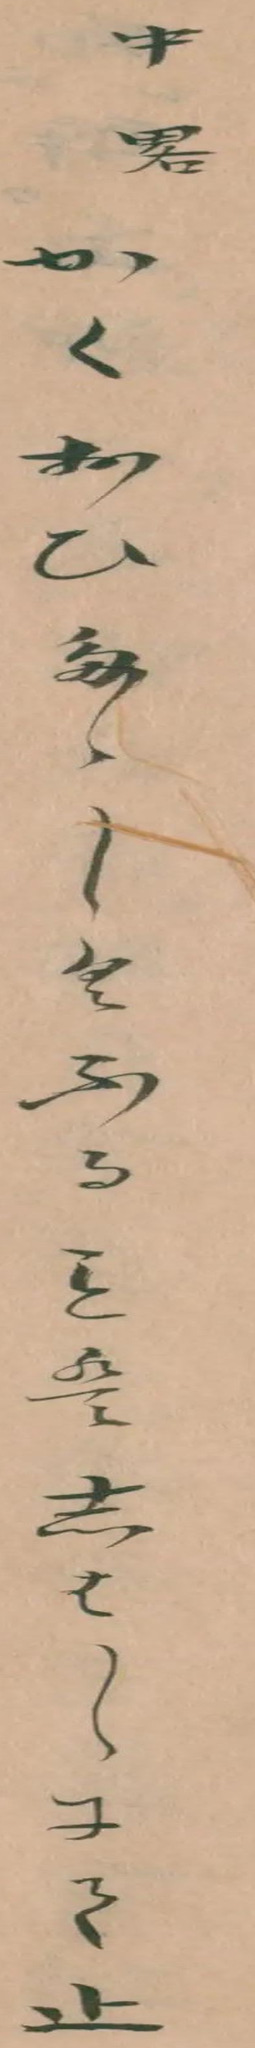中略かくおひたゝしくふることはしはしにて止
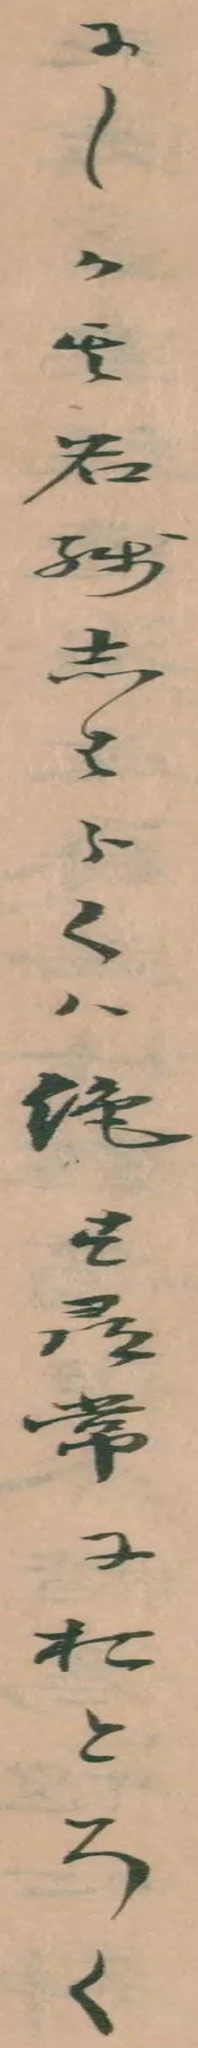にしか其名残しはらくは絶す尋常におとろく
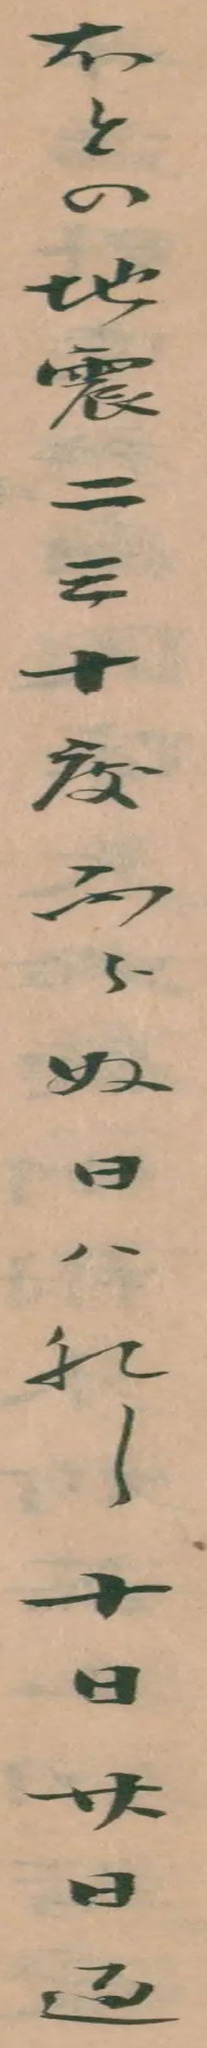ほとの地震二三十度ふらぬ日はなし十日廿日過
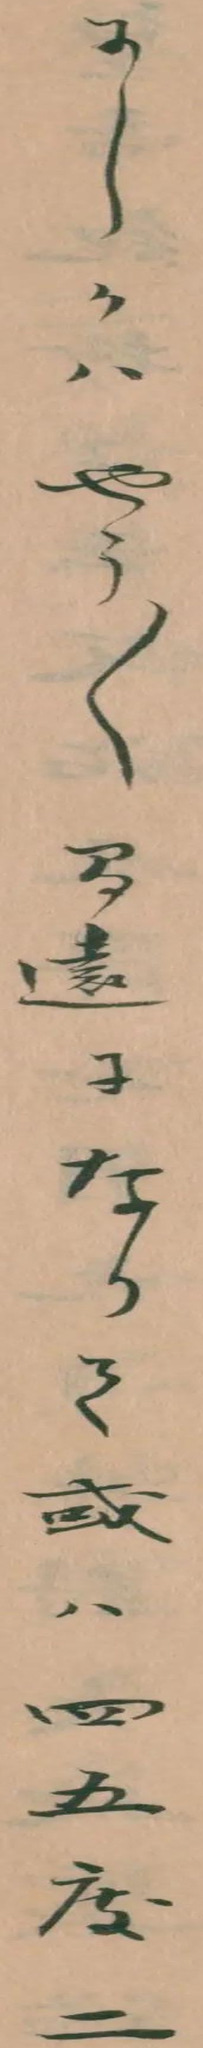にしかはやう〳〵間遠になりて或は四五度二
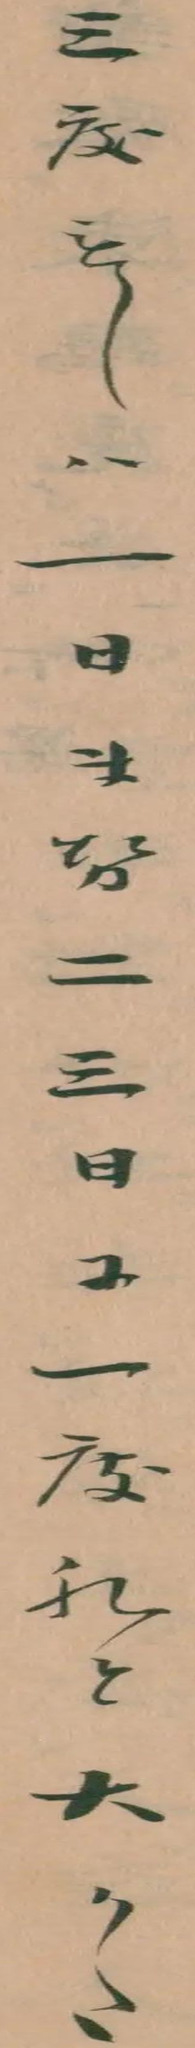三度もしは一日ませ二三日に一度なと大かた
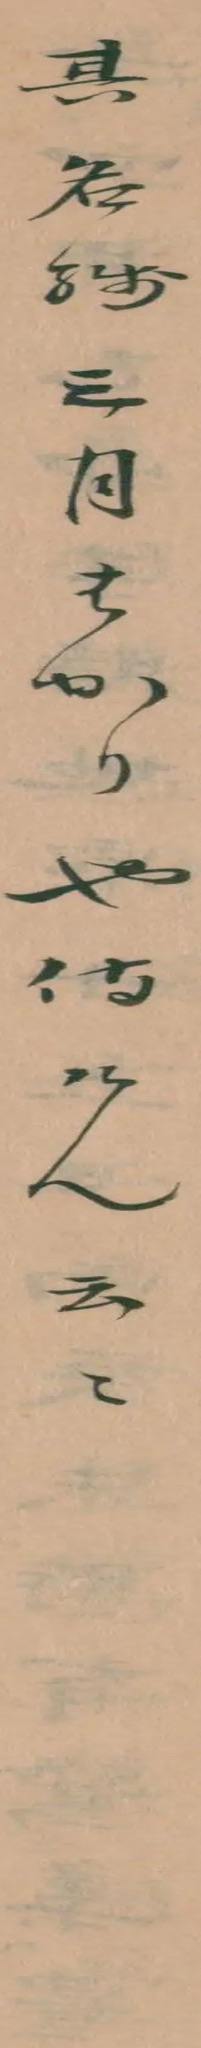其名残三月はかりや侍けん云々
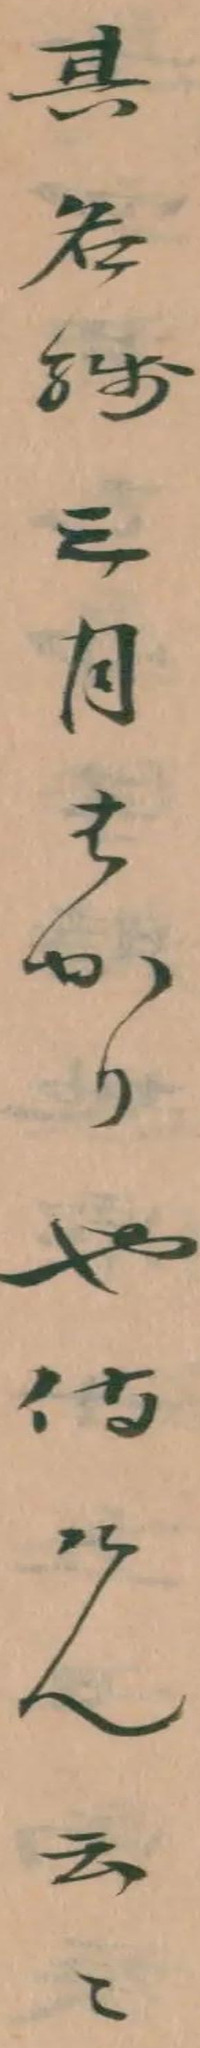其名残三月はかりや侍けん云々
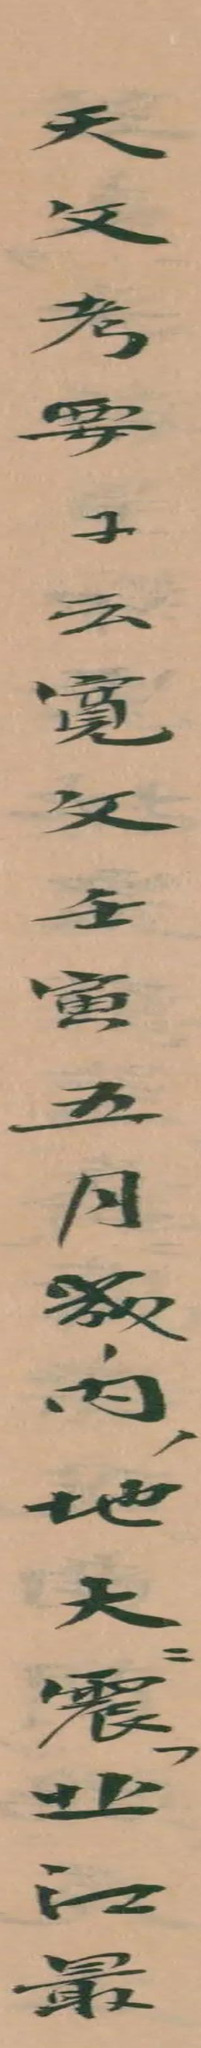天文考要に云寛文壬寅五月畿-内地大震北江最
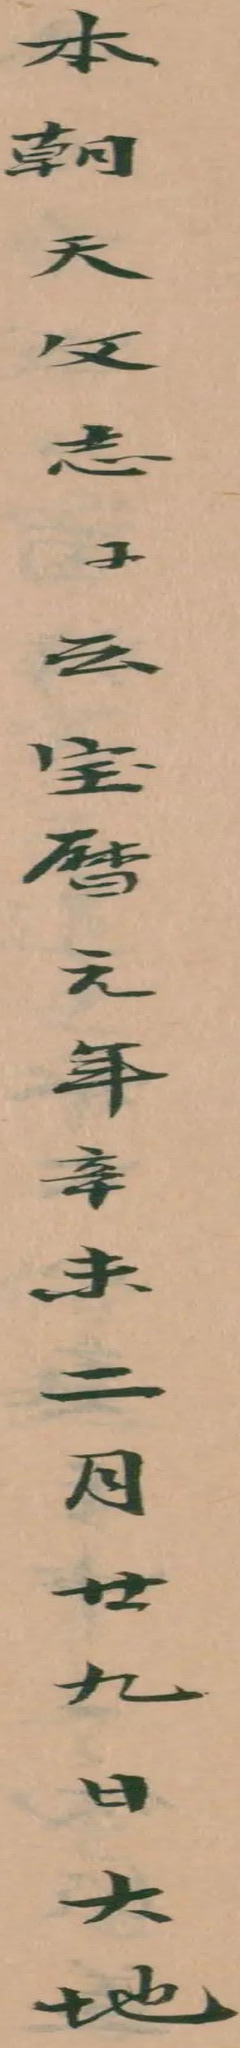本朝天文志に云宝暦元年辛未二月廿九日大地
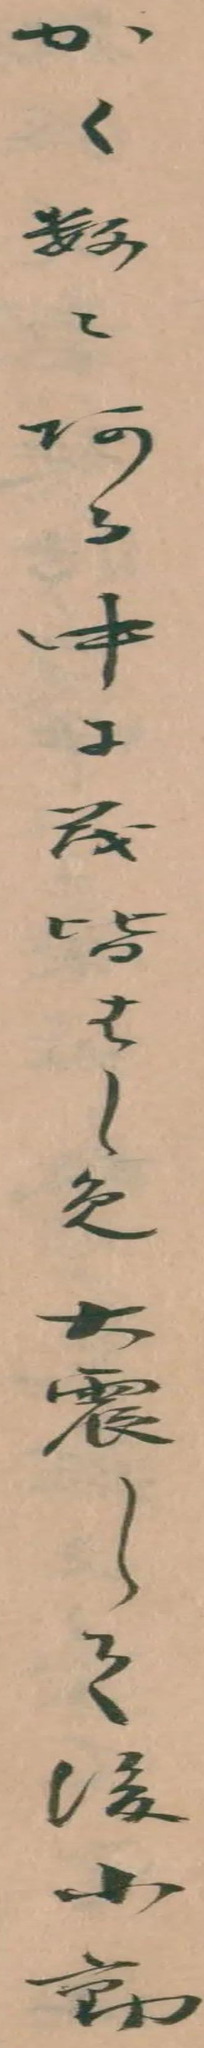かく数々ある中にも皆はしめ大震して後小動
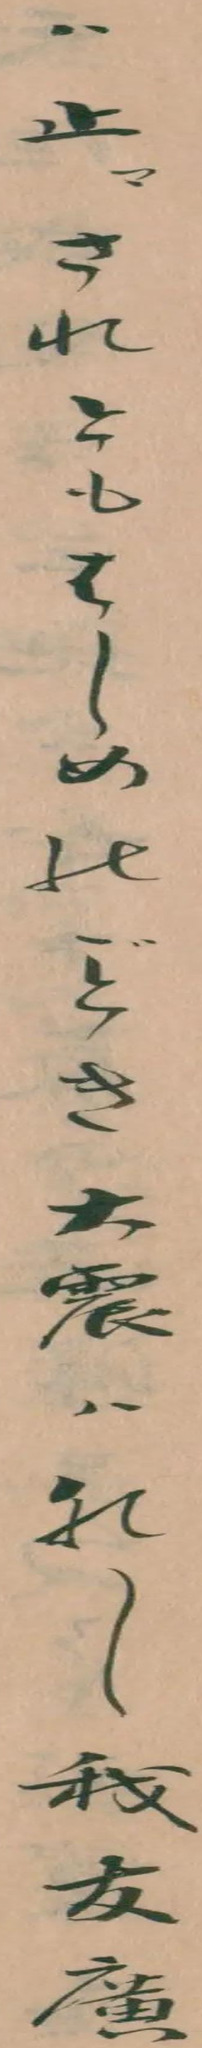は止されともはしめのごとき大震はなし我友広
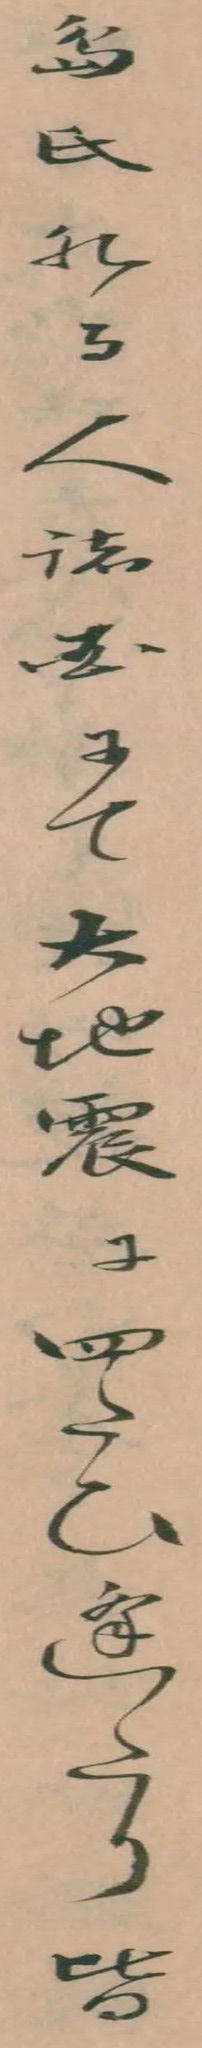島氏なる人諸国にて大地震に四たひ逢たり皆
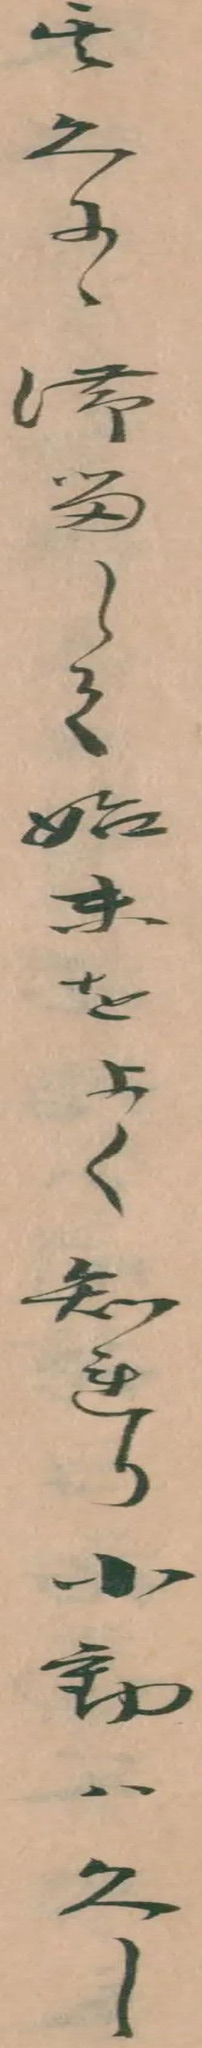其くにゝ滞留して始末をよく知れり小動は久し
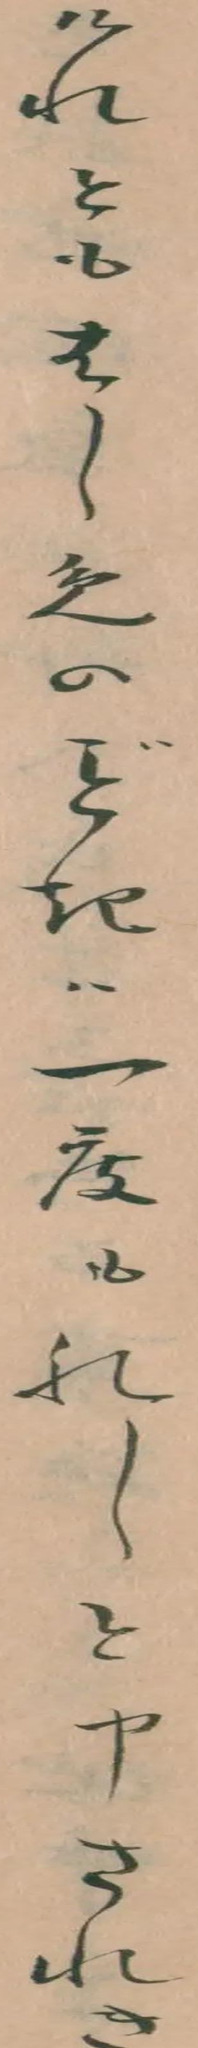けれともはしめのごときは一度もなしと申されき
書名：地災撮要. 巻5-6(地震之部)
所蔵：国立国会図書館 National Diet Library, JAPAN
